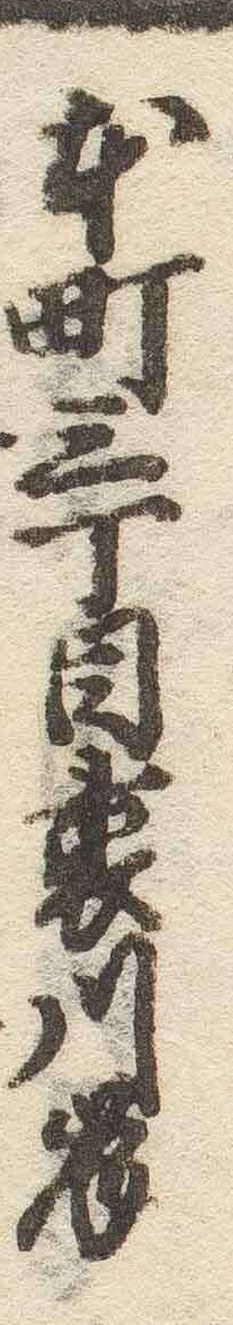本町三丁目裏川岸
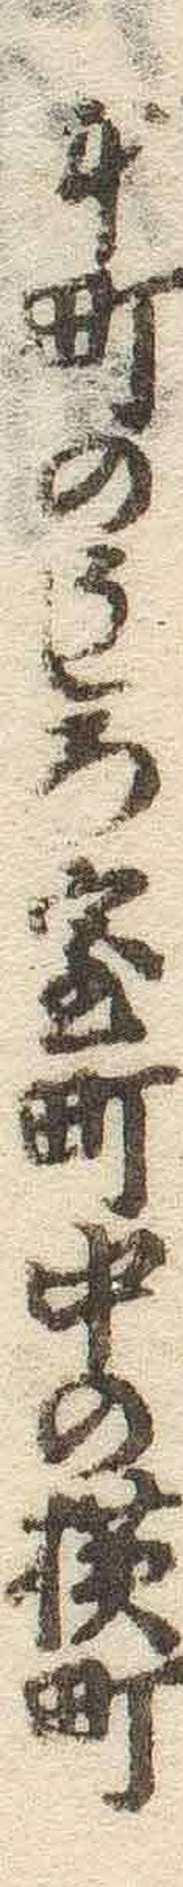本町のうしろ室町中の横町
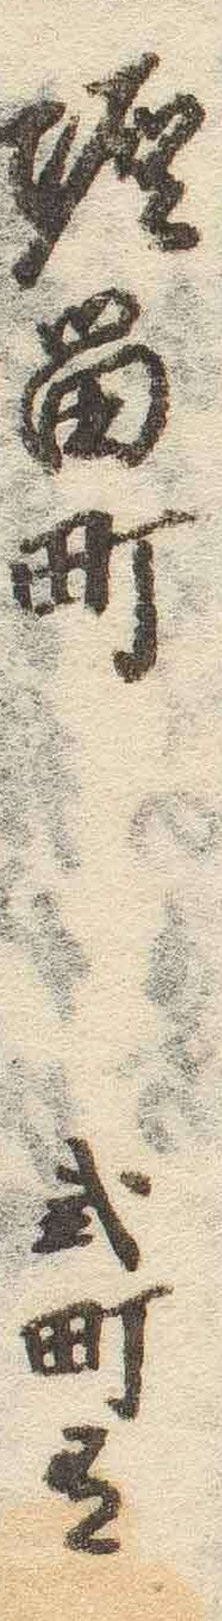掘留町弐町有
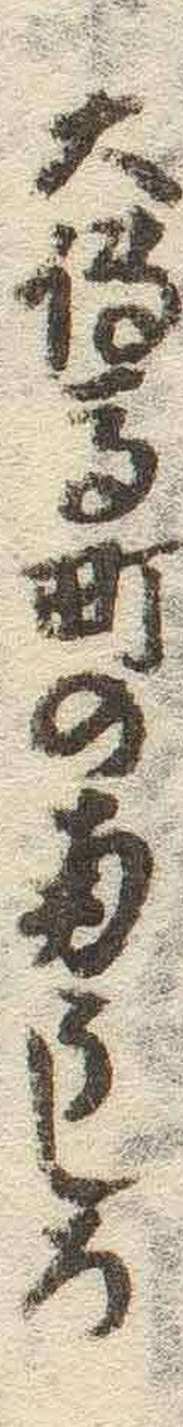大伝馬町の南うしろ
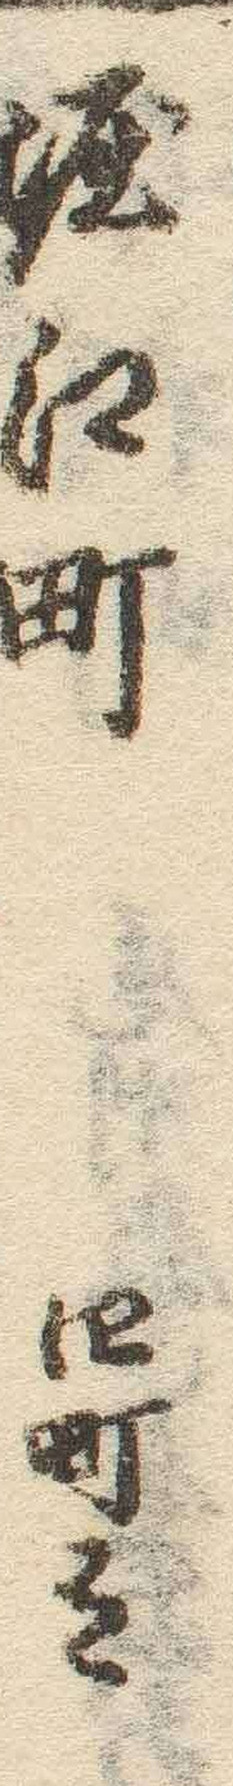堀江町四町有
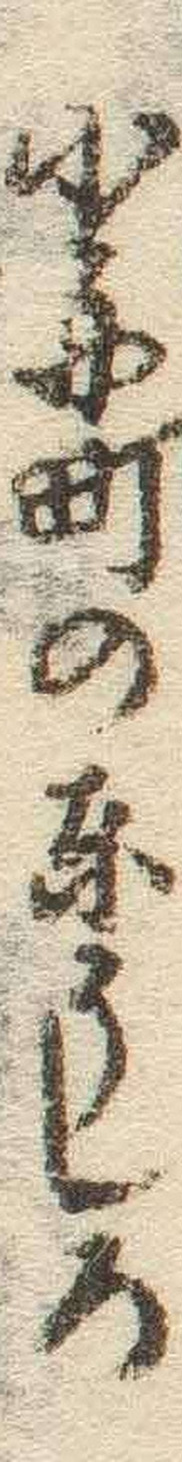小舟町の東うしろ
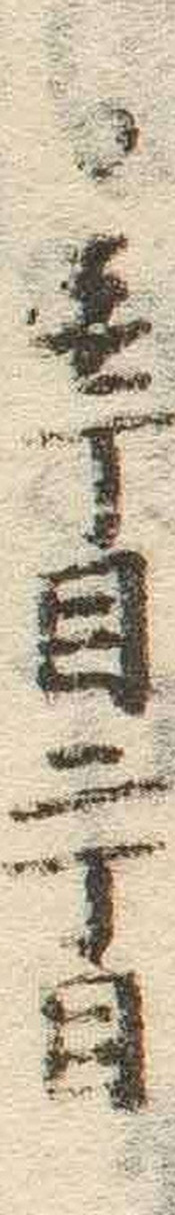◦壱丁目二丁目
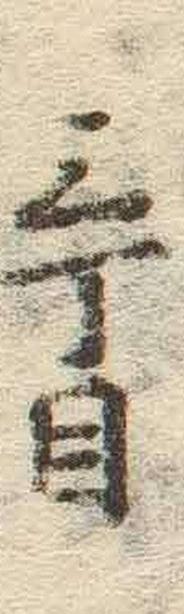三丁目
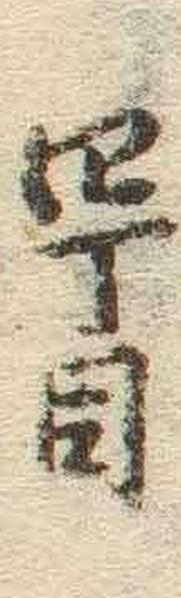四丁目
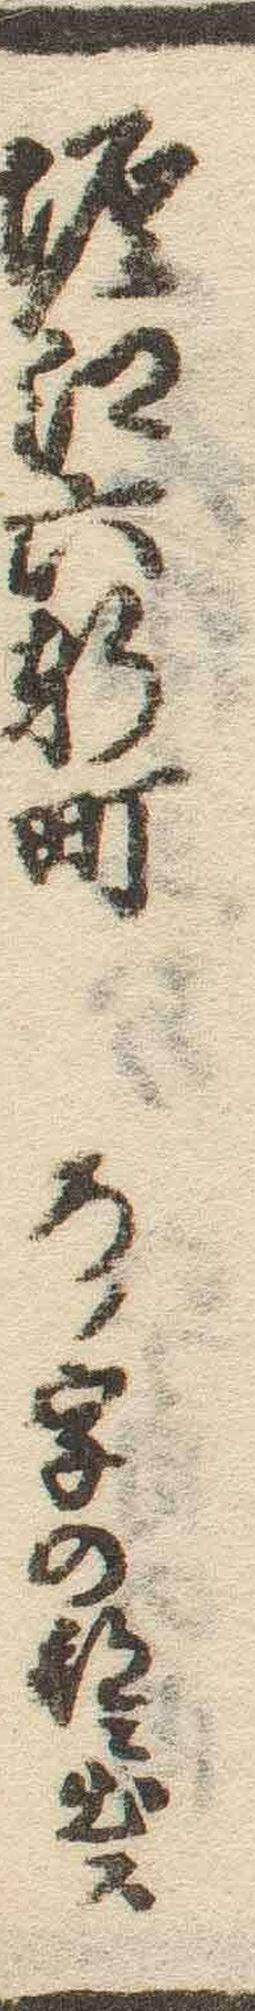堀江六軒町ろノ字の部に出す
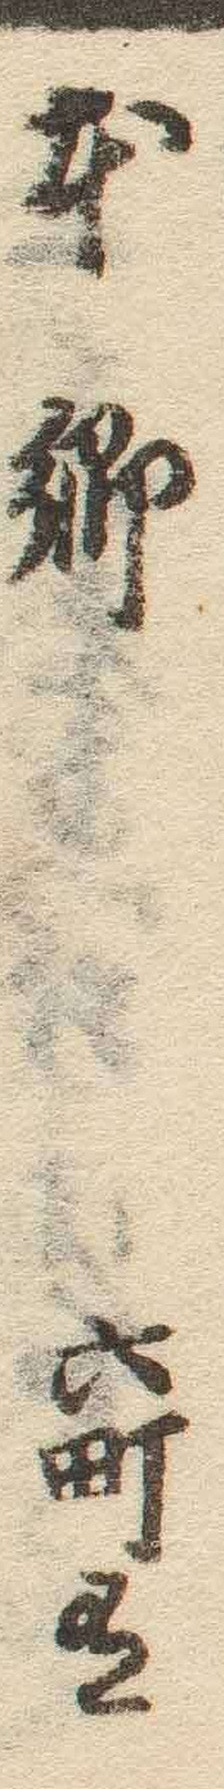本郷六町有
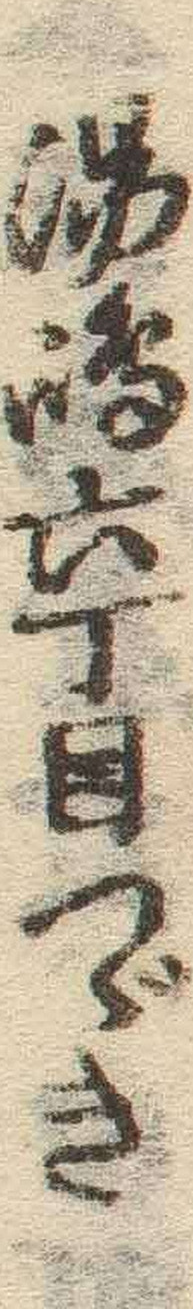湯島六丁目のつゞき
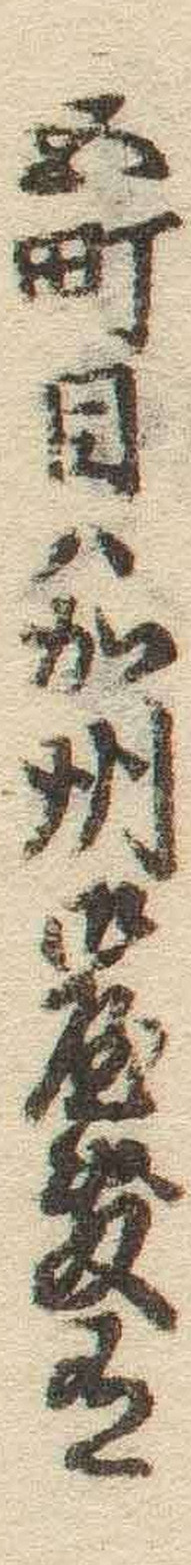五町目は加州御屋敷有

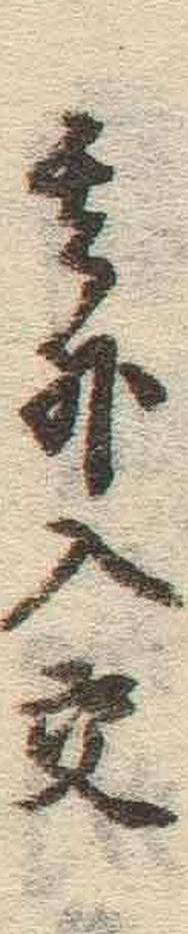其外入交
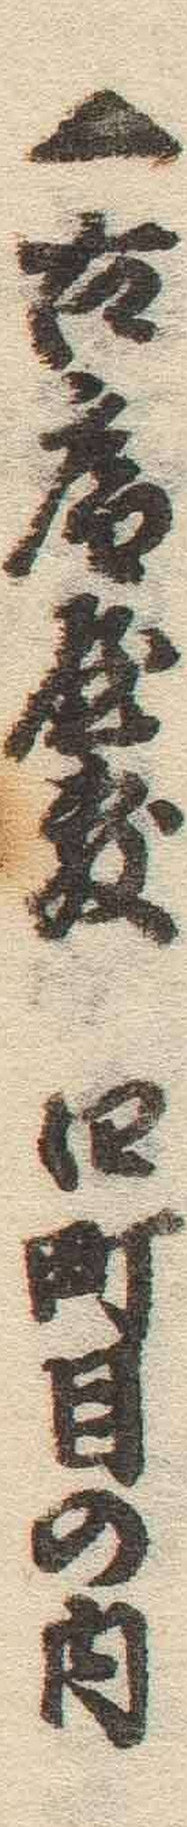▲古庵屋敷四丁目の内
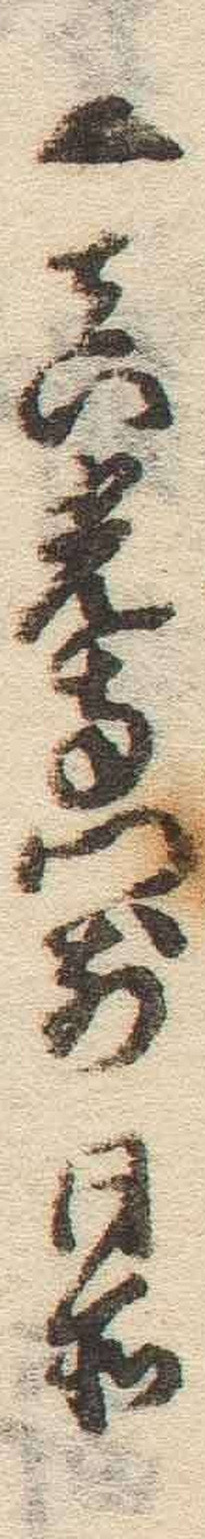▲真光寺門前同所
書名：江戸町独案内
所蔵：東京学芸大学附属図書館 国文学研究資料館
